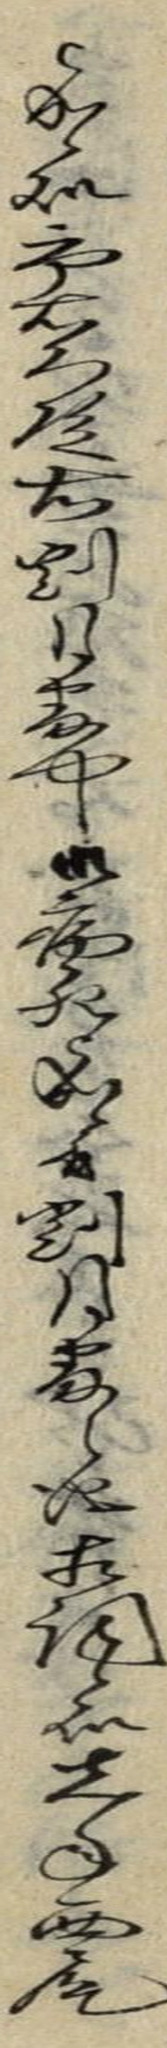被成候処市右衛門殿右割月番中御病死被成候に付割月番之儀相調候処先年西尾
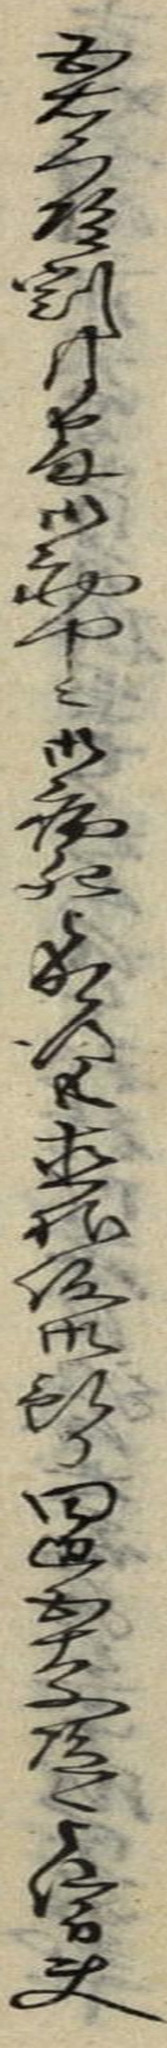五右衛門殿割月番御勤中に御病死被成候得共直様仮御預り田辺五太夫殿へ被仰付夫
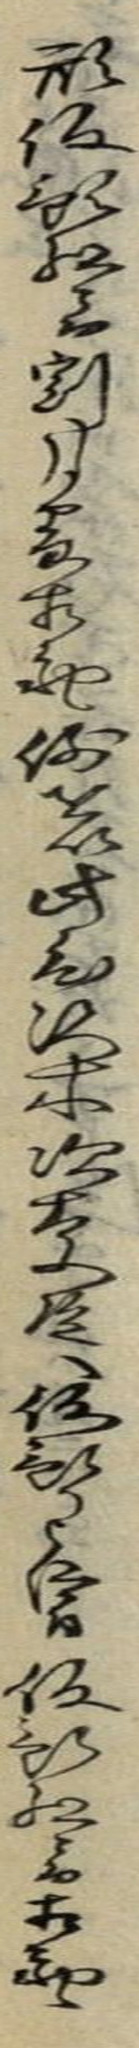形仮預組に而割月番相勤候例を以此度沢木次太夫殿へ仮預り被仰付仮預組に而相勤候
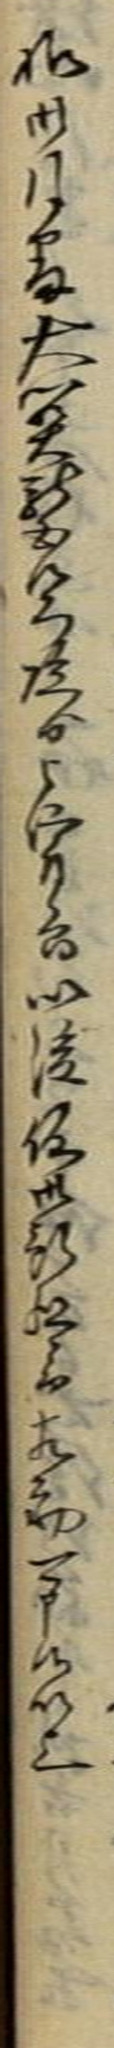様御月番大関新五左衛門殿ゟ被仰付候間以後仮御預組に而可相勤候以上
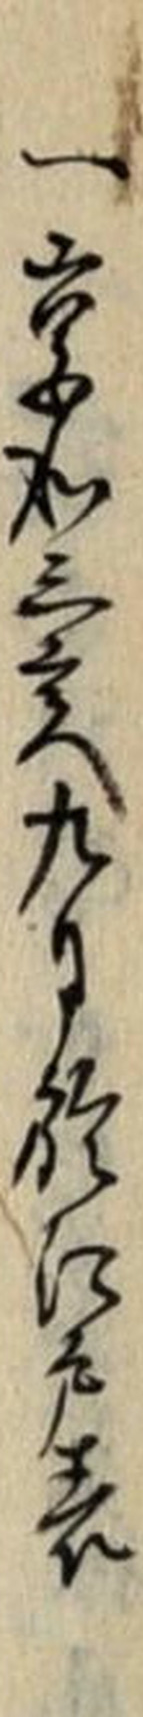一享和三亥九月於江戸表
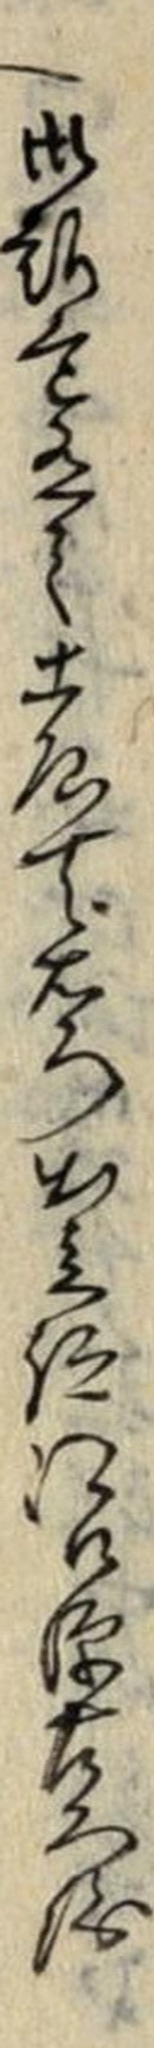御趣意有之土屋十郎右衛門出立跡江口源左衛門儀
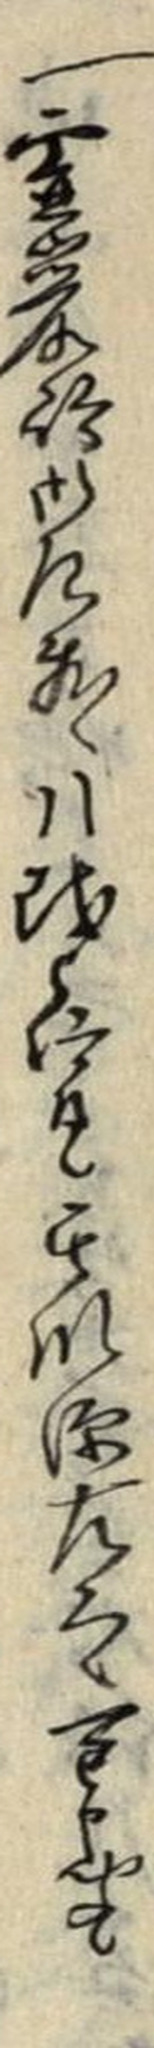霊岸嶋御屋敷へ引越被仰付候其段源左衛門へ可申聞候
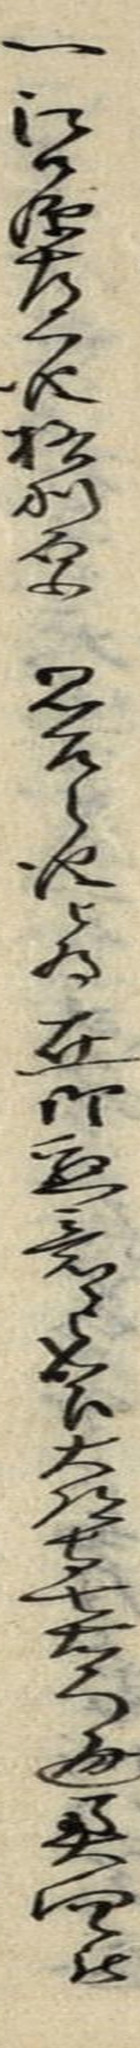一江口源左衛門儀各別厚思召候儀被為在御懇意に被成下大道寺七右衛門通奥向へ被
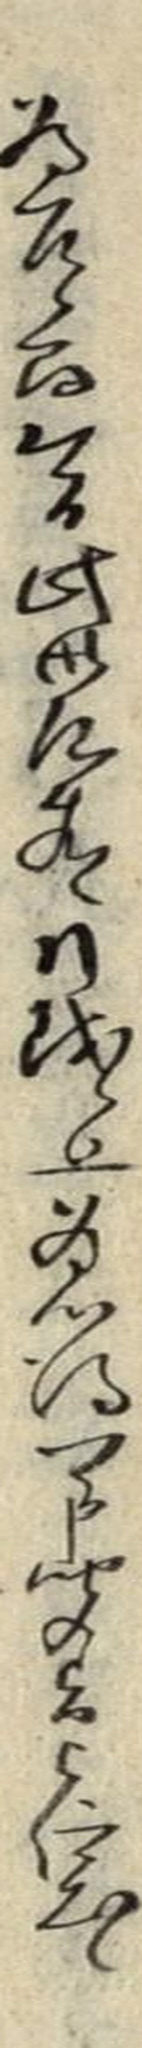為召候間今日此御屋敷へ引越候上為心得可申聞旨被仰出候
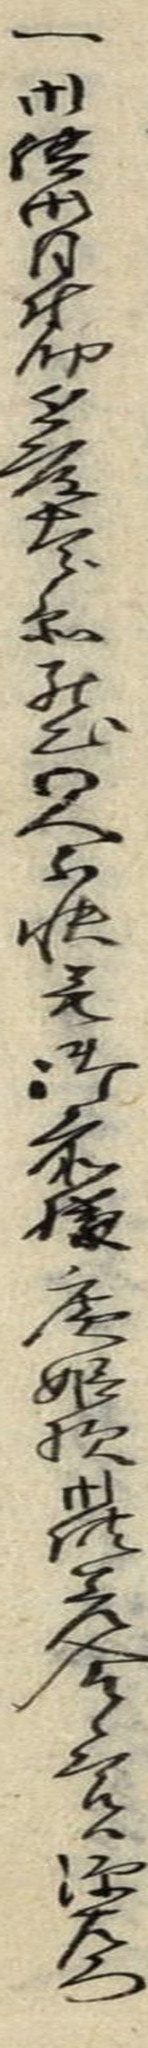一御供御目付助近藤太郎兵衛罷出同人不快并御前様広姫様御供差合候節は源左衛門
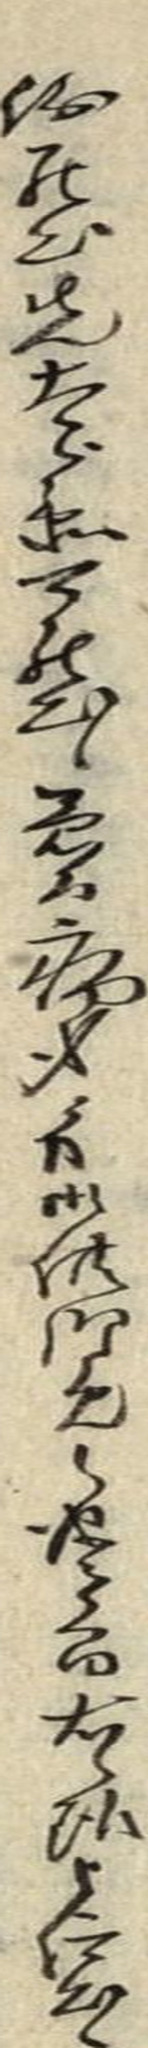儀罷出先太郎兵衛可罷出候兼而病身に付御供御免之儀に候間右之趣被仰出候
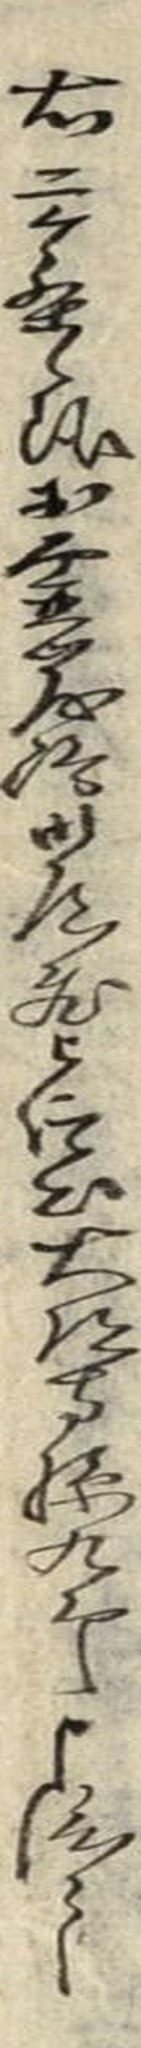右二ヶ条之趣於霊岸嶋御屋敷被仰出大道寺孫九郎申渡之
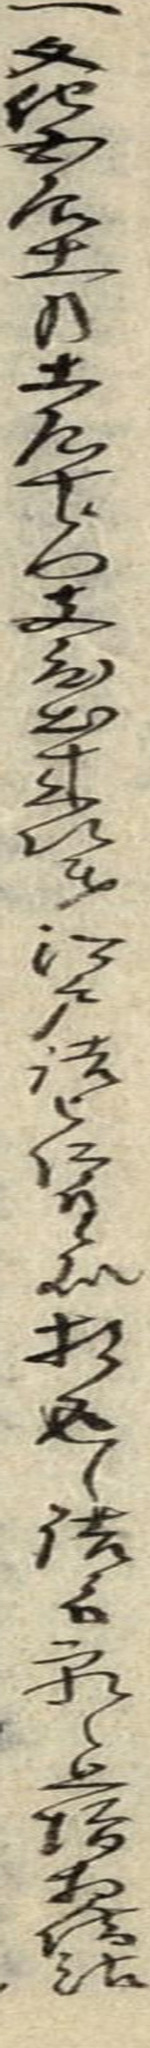一文化五辰十一月土屋十郎右衛門支度出来次第江戸詰被仰付候処折返之詰に付願之上増拝借銀
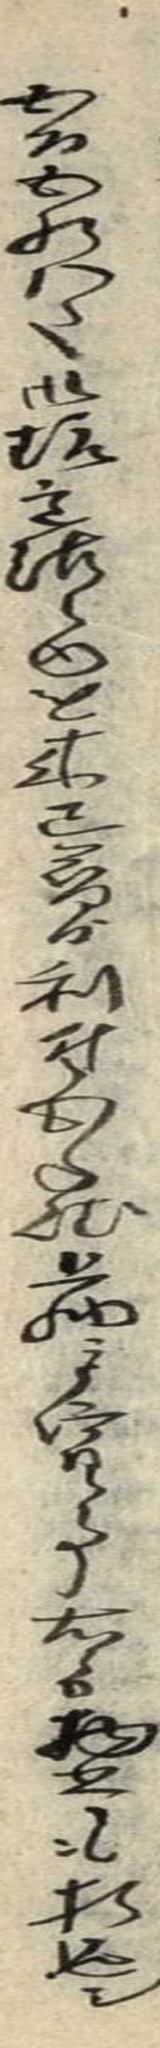五百五拾八匁御趣意銀之内を来巳暮ゟ利付五年賦上納に被仰付候事右に付物書にも折返し
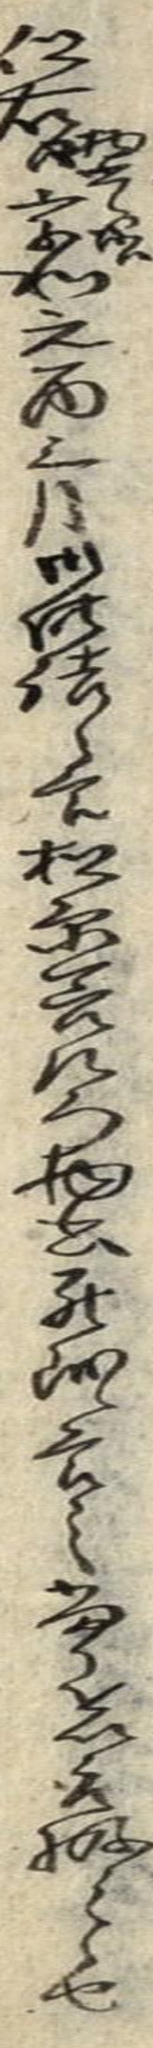但右之内物書之儀は享和元酉三月御供詰之節松原善左衛門物書罷越候節之当りを以取扱候由
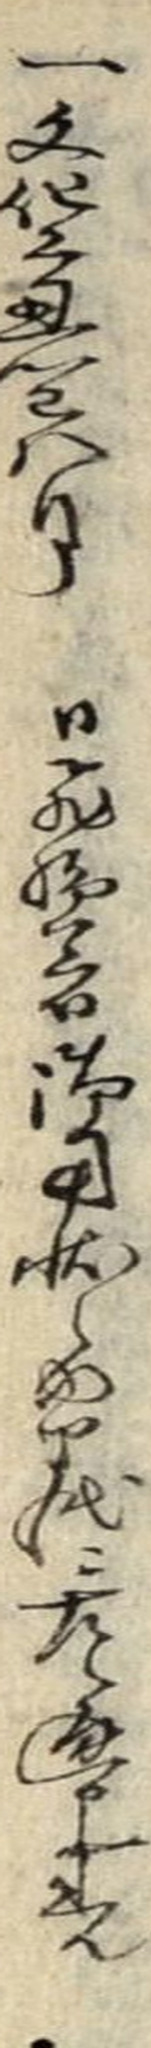一文化二丑閏八月日飛脚着御用状之内半紙に左之通申来る
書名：蒐輯之部
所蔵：福井県文書館 Fukui Prefectural Archives
